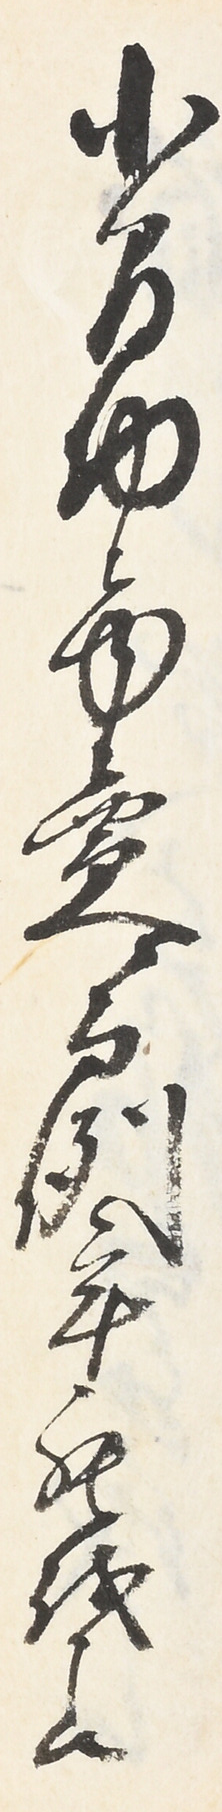小間商売ニ而例年罷越申候
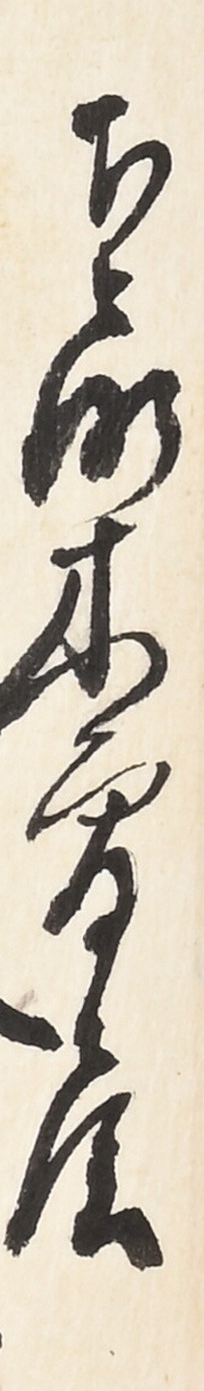下モ町木曽屋
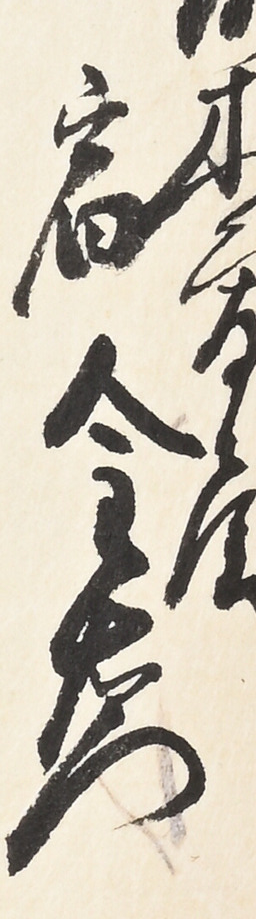宿金右衛門
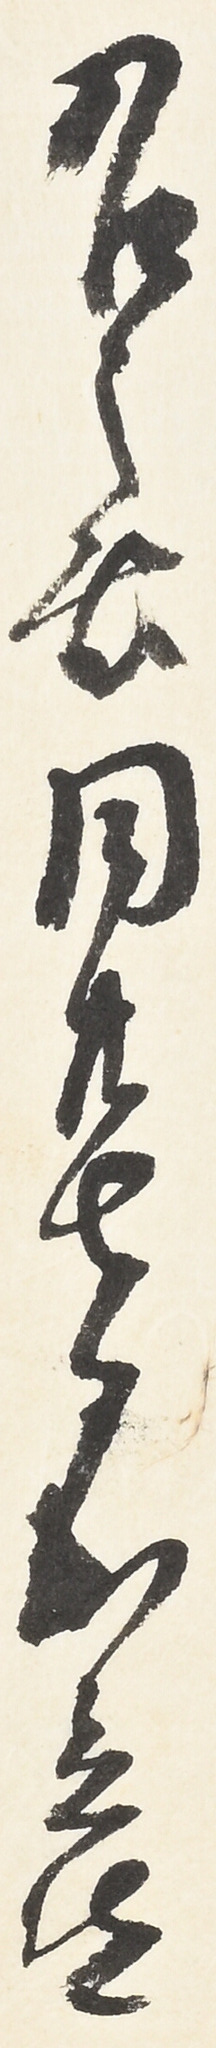右之者同廿七日出立仕候
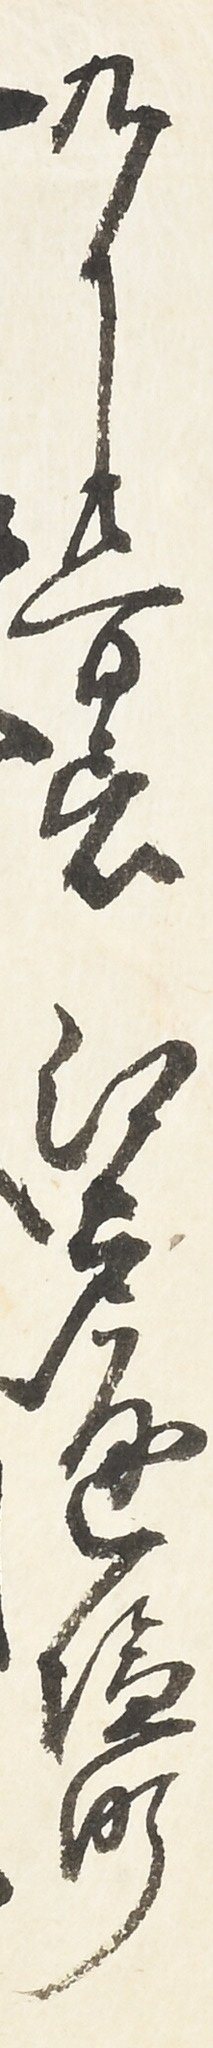九月廿一日着江戸通塩町
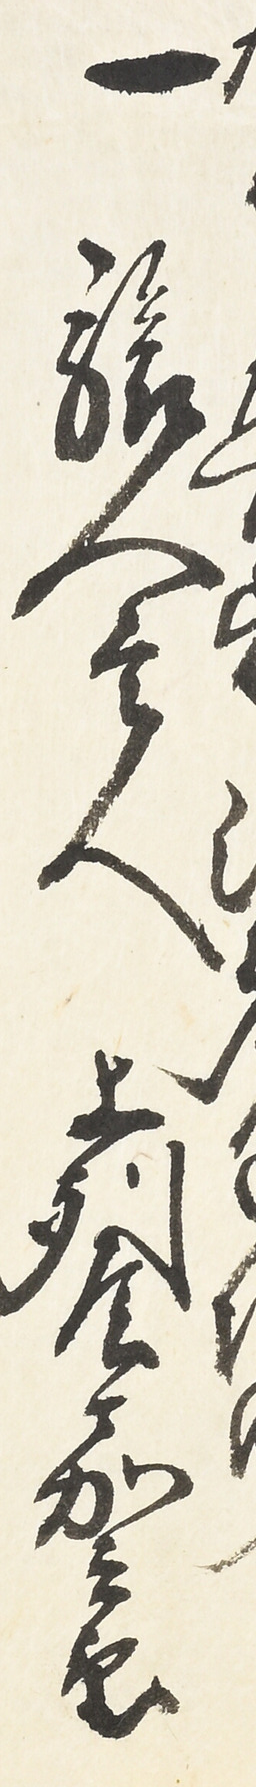一旅人壱人上州屋嘉兵衛
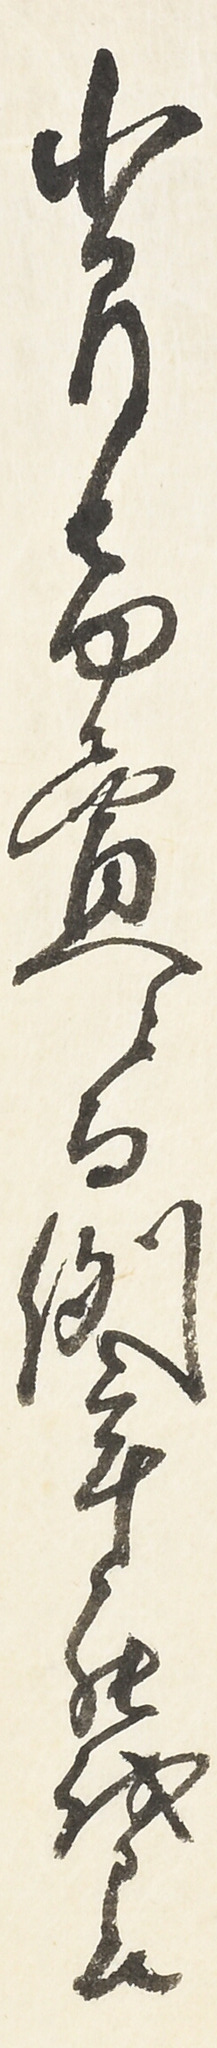小間商売ニ而例年罷越申候
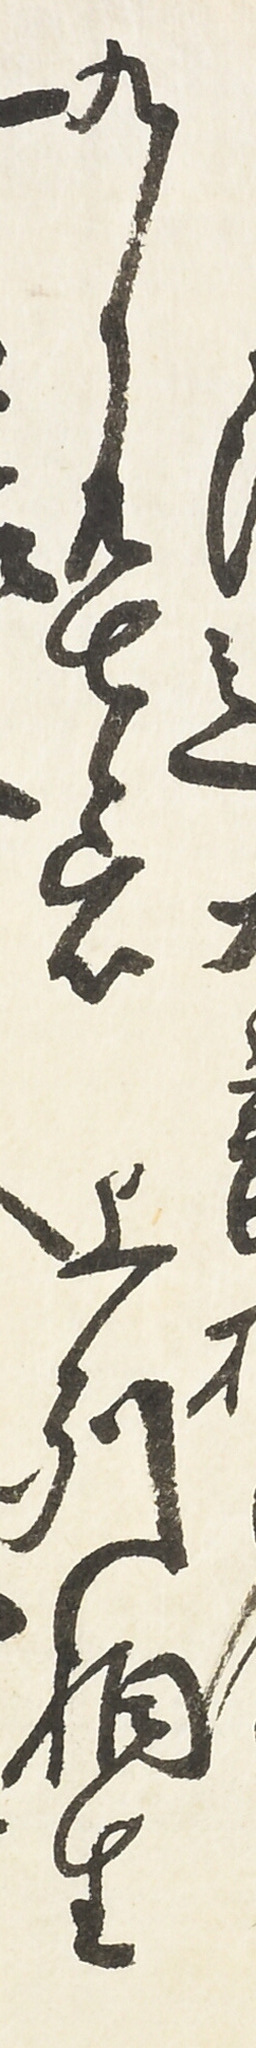九月廿七着上州桐生
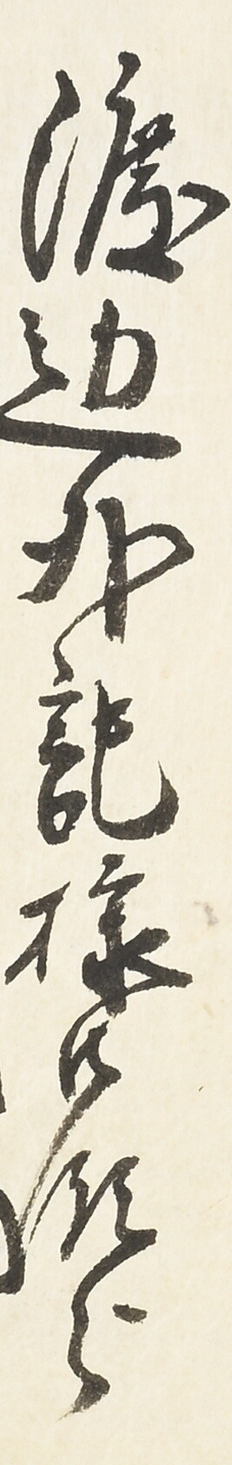渡辺外記様御領分
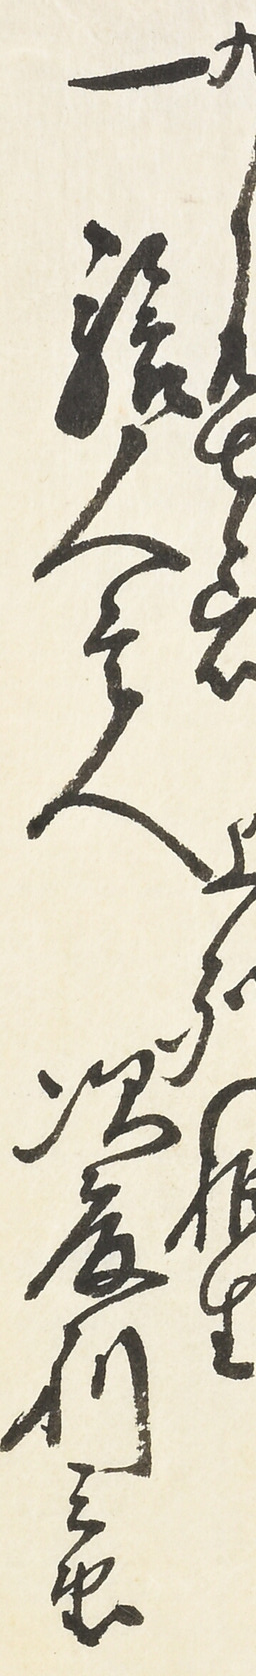一旅人壱人次藤利兵衛
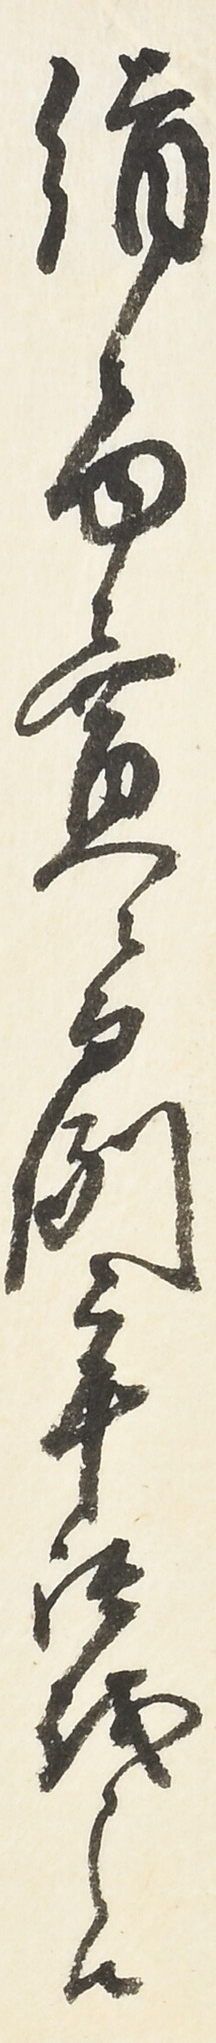絹商売ニ而例年罷越申候
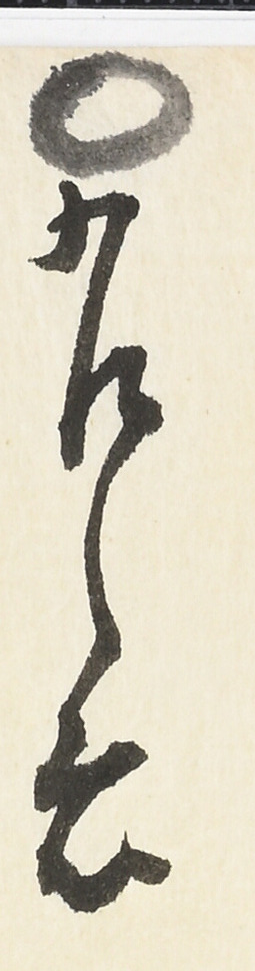〇右之者
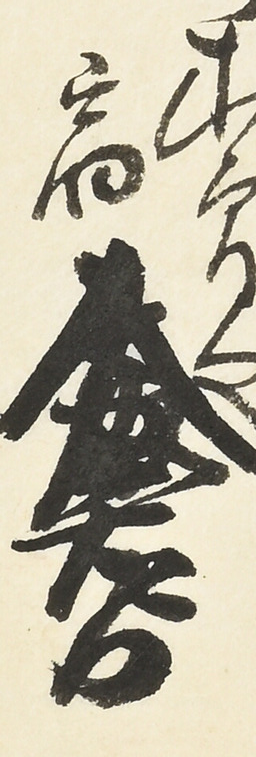宿金右衛門
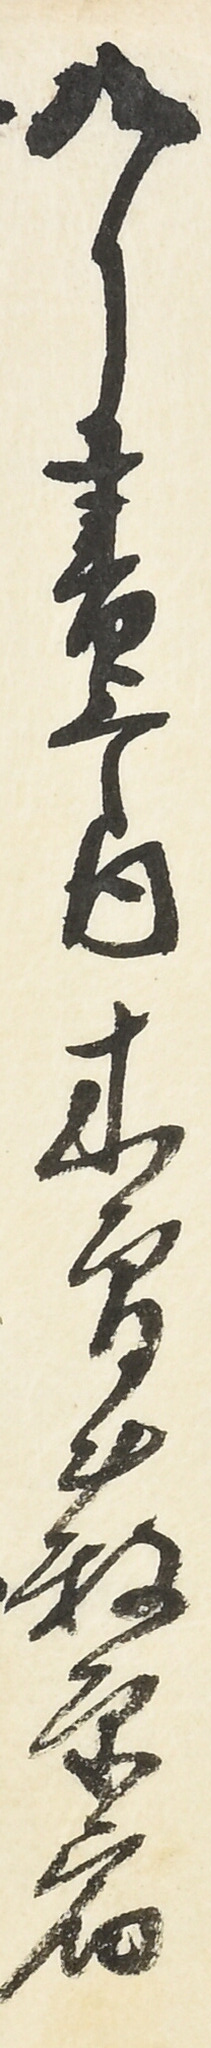八月書上之内木曽藪原宿
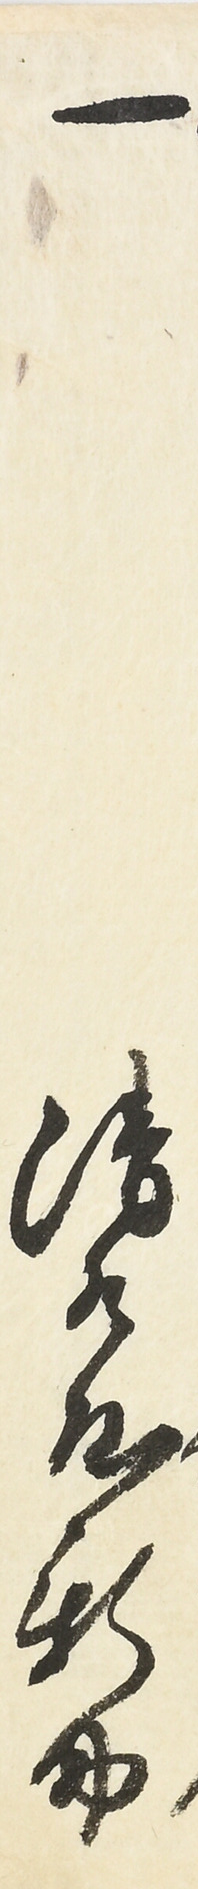一清水屋新助
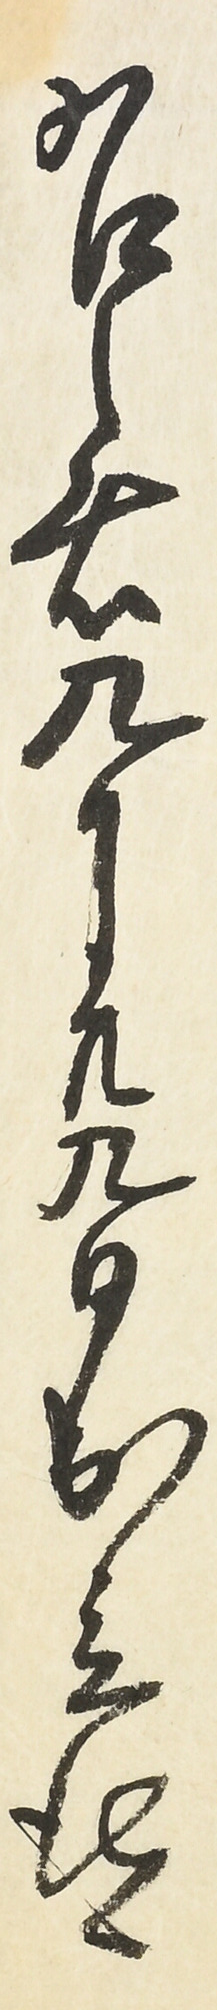右之者九月廿九日出立仕候
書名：町中旅人泊控帳
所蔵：伊那市立高遠町図書館・合同会社AMANE
